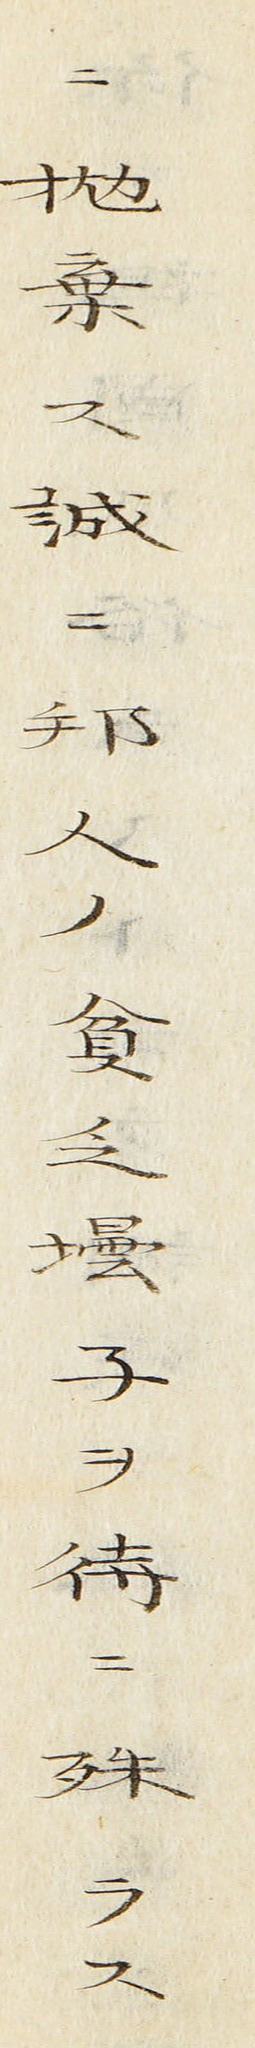ニ抛棄ス誠ニ邦人ノ貧乏壜子ヲ待ニ殊ラス
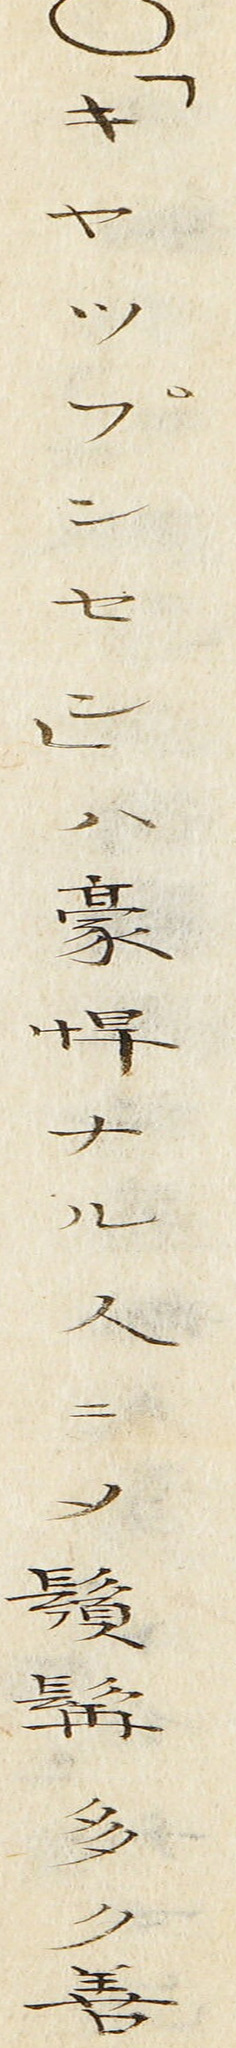○「キヤツプンセン」ハ豪悍ナル人ニシテ鬚髯多ク善
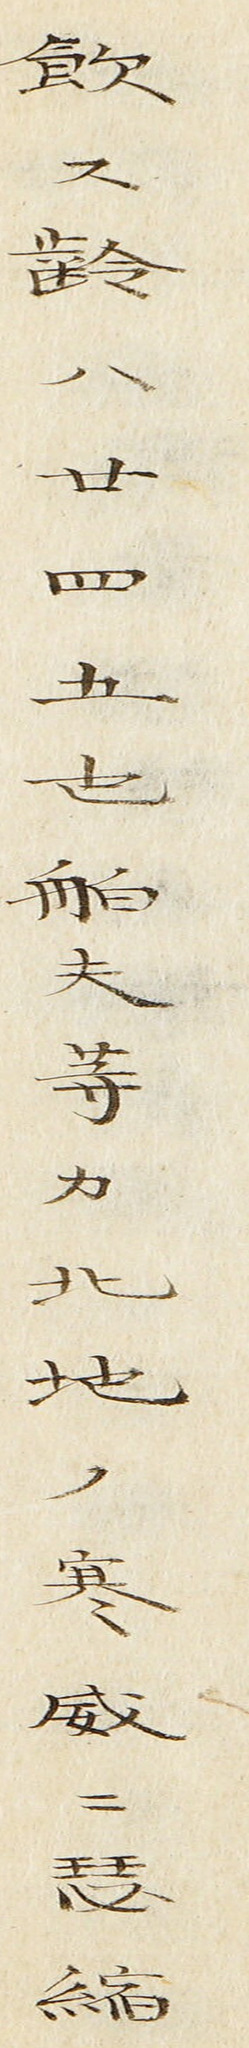飲ス齢ハ廿四五也舶夫等カ北地ノ寒威ニ瑟縮
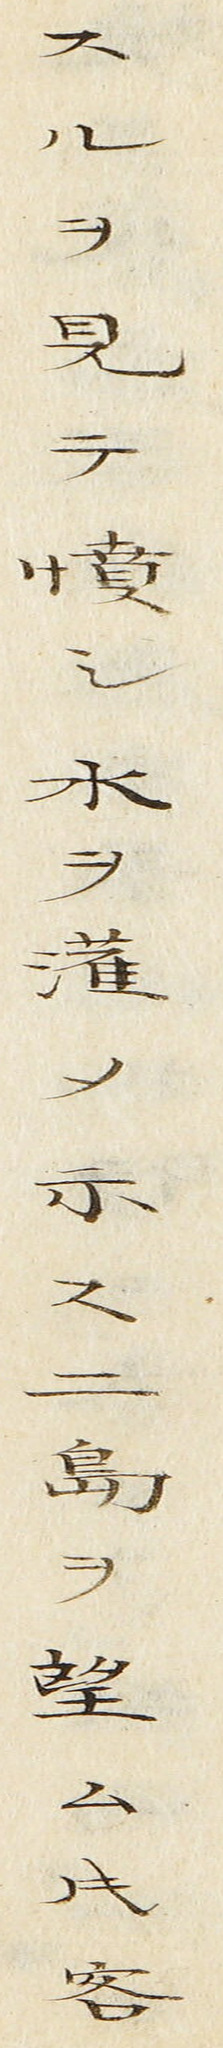スルヲ見テ憤シ水ヲ灌シテ示ス二島ヲ望ムトキ客
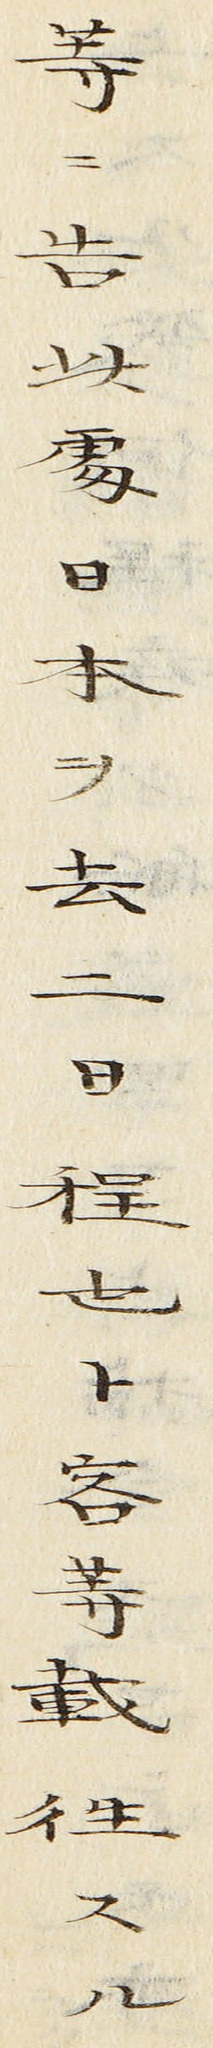等ニ告此処日本ヲ去二日程也ト客等載往スル
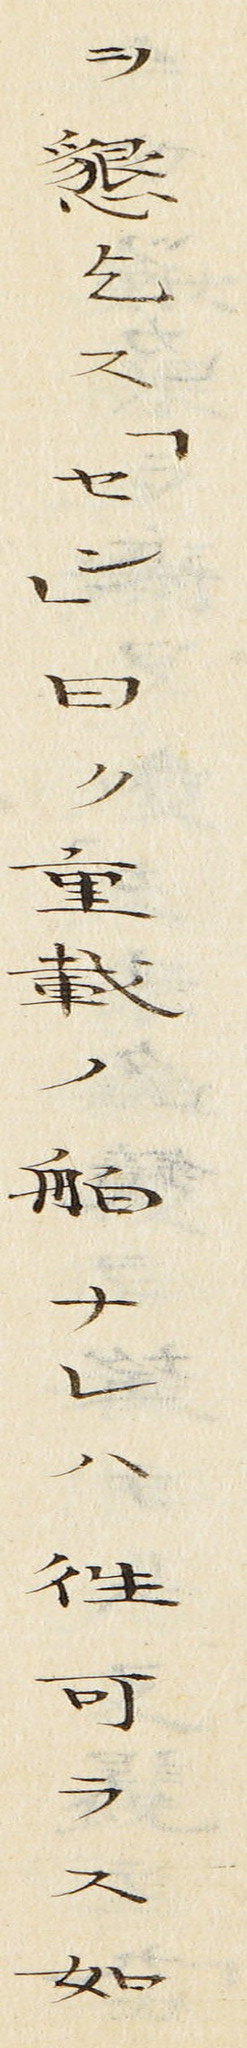ヲ懇乞ス「セン」曰ク重載ノ舶ナレハ往可ラス如
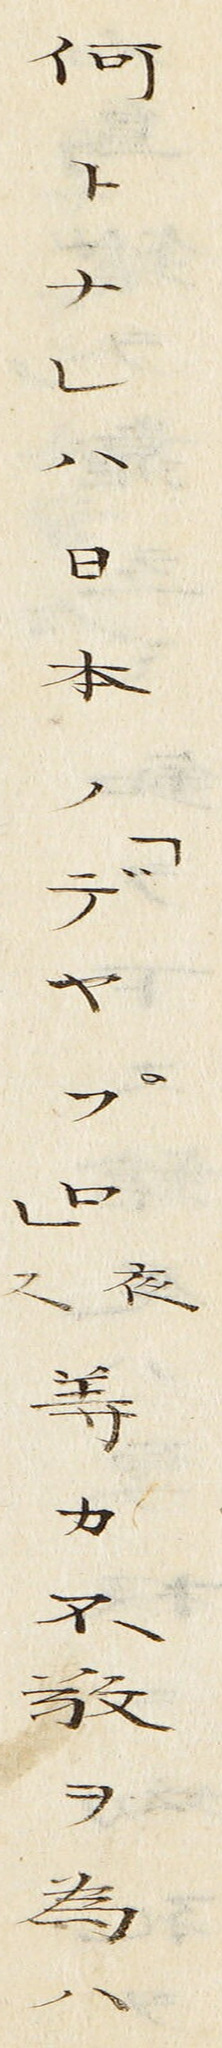何トナレハ日本ノ「デヤプロ」夜叉等カ不敬ヲ為ハ
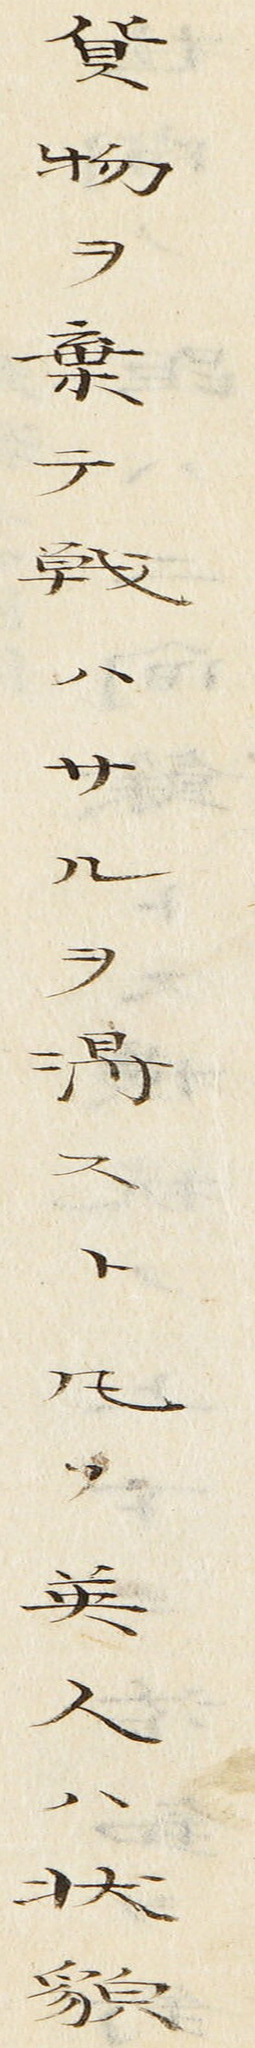貨物ヲ棄テ戦ハサルヲ得スト凡ソ英人ハ状貌
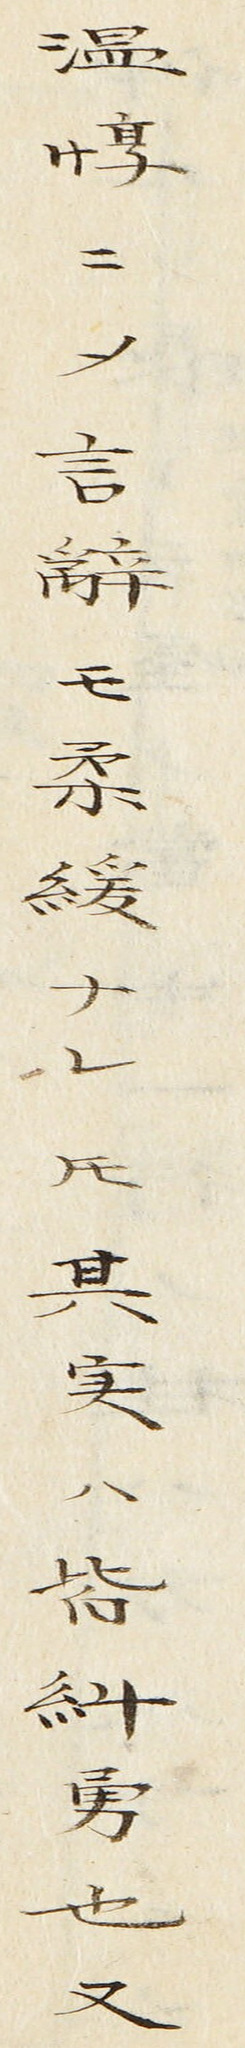温惇ニシテ言辞モ柔緩ナレトモ其実ハ皆糾勇也又
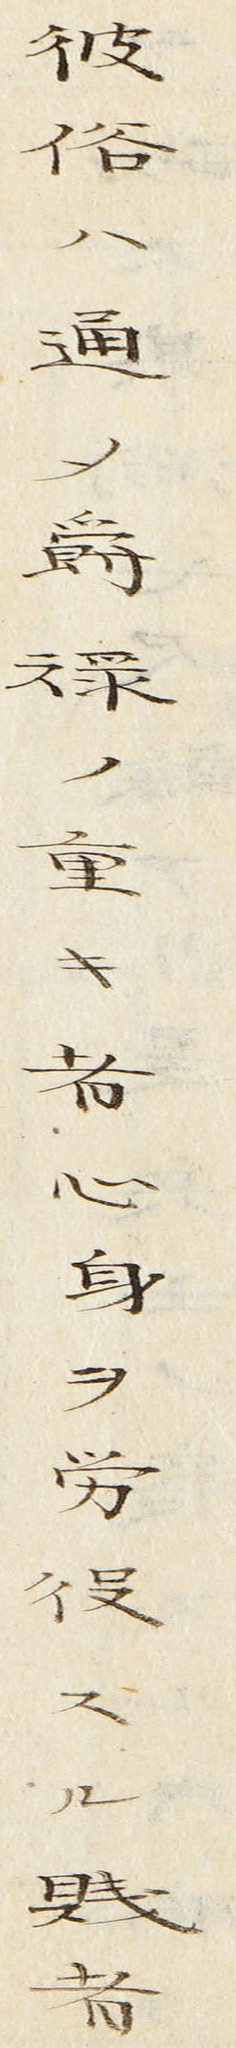彼俗ハ通シテ爵禄ノ重キ者心身ヲ労役スル賤者
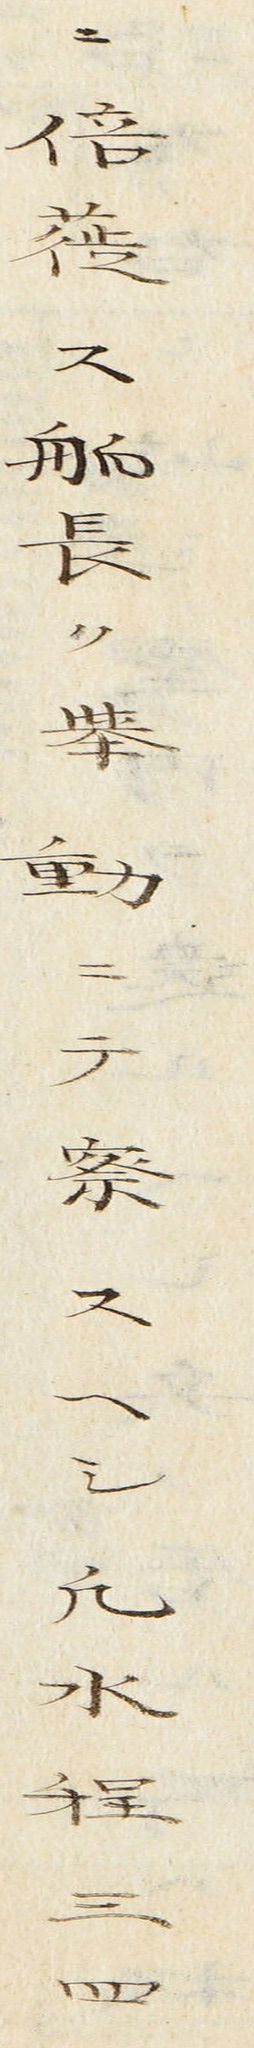ニ倍蓰ス舶長ク挙動ニテ察スヘシ凡水程三四
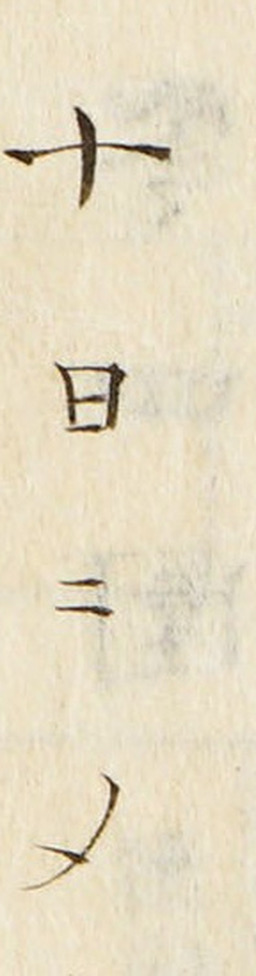十日ニシテ
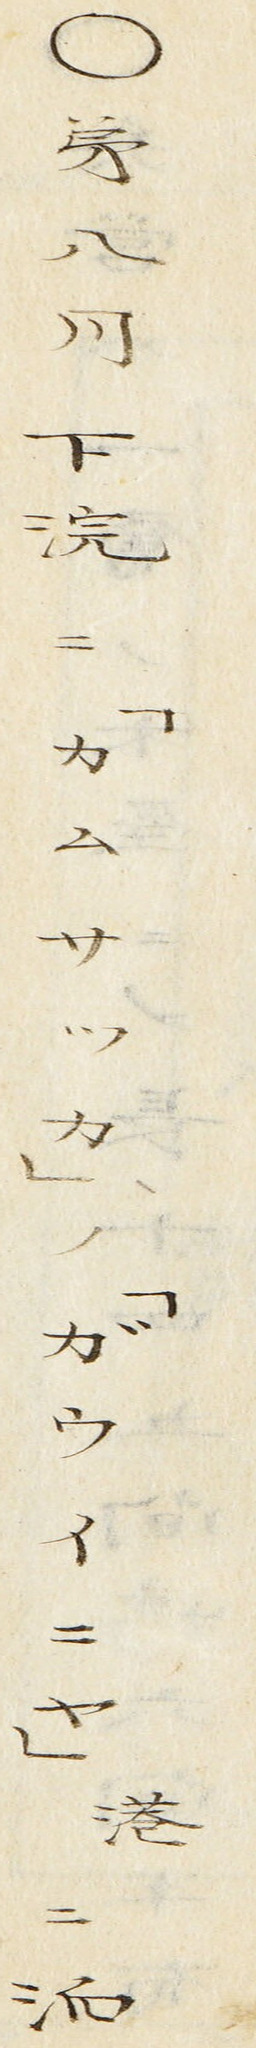○第八月下浣ニ「カムサツカ」ノ「ガウイニヤ」港ニ泊
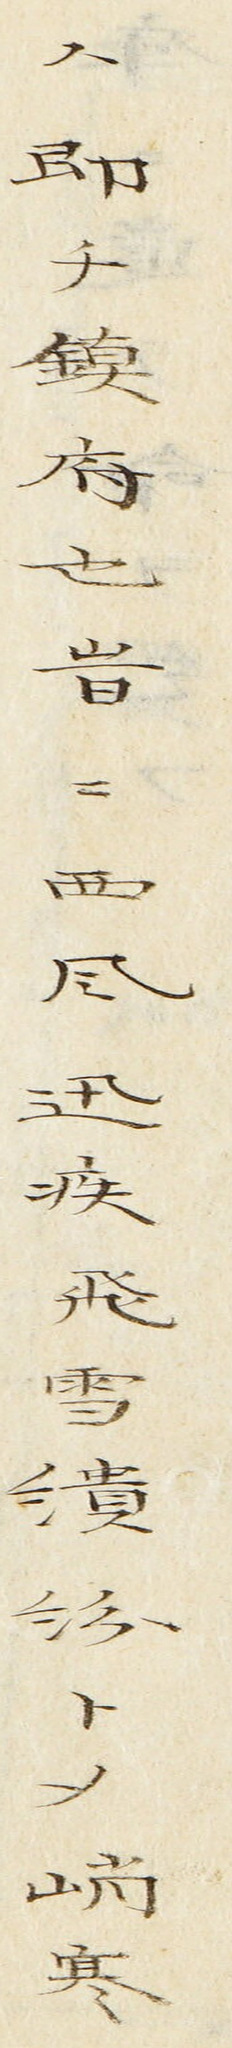ス即チ鎮府也時ニ西風迅疾飛雪繢紛トシテ峭寒
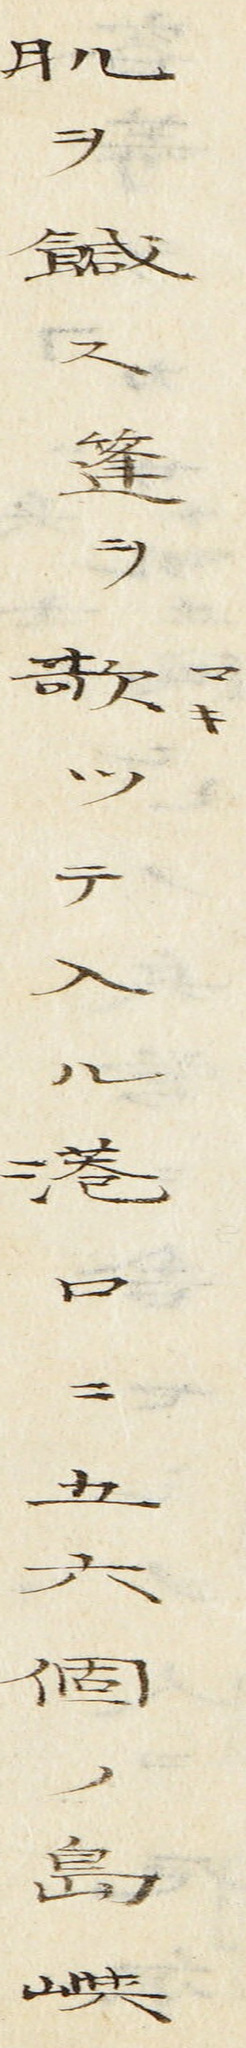肌ヲス篷ヲ欹ツテ入ル港口ニ五六個ノ島嶼

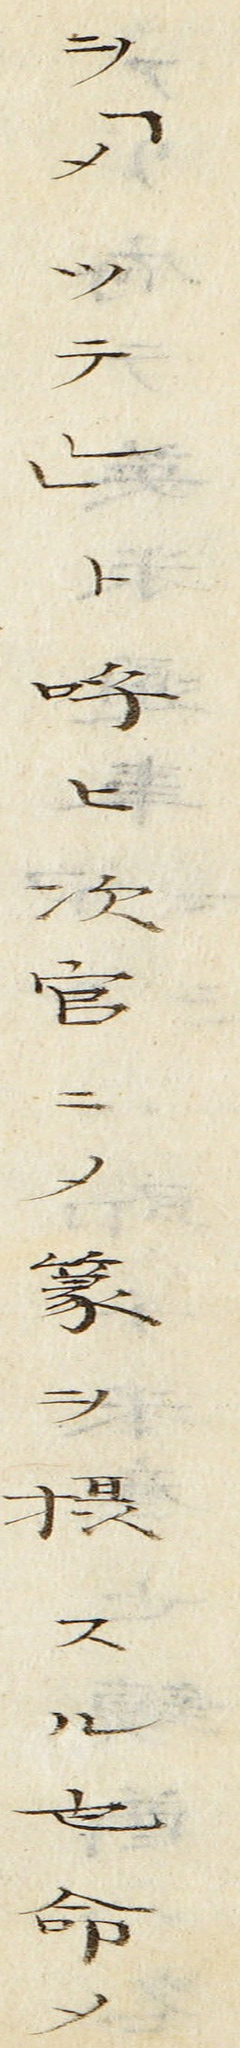ヲ「メツテレ」ト呼ヒ次官ニシテ篆ヲ摂スル也命シテ
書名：蕃談
